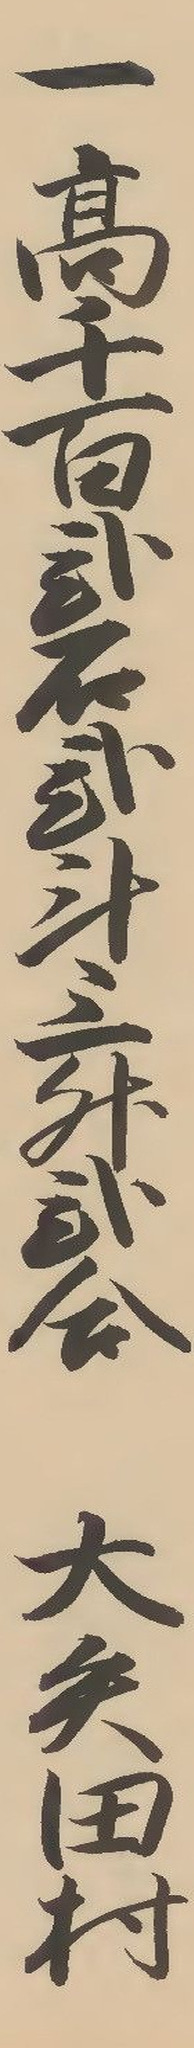一高千百弐石弐斗三升弐合大矢田村

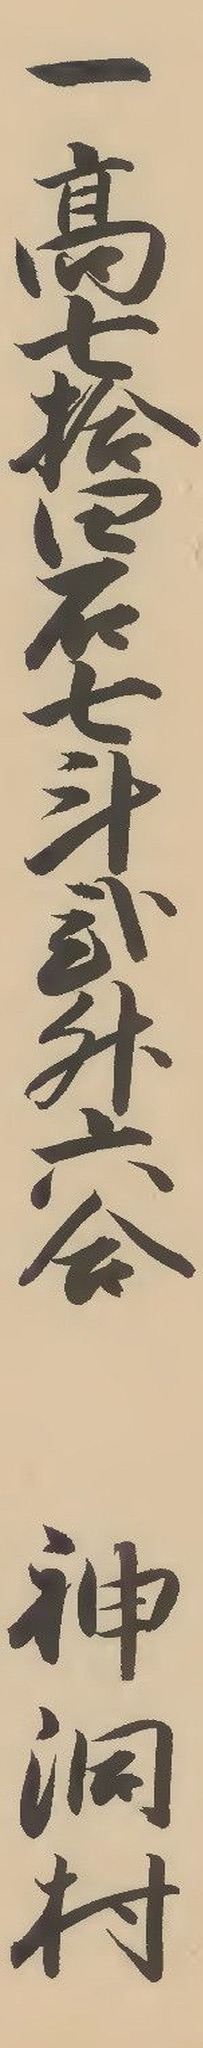一高七拾四石七斗弐升六合神洞村
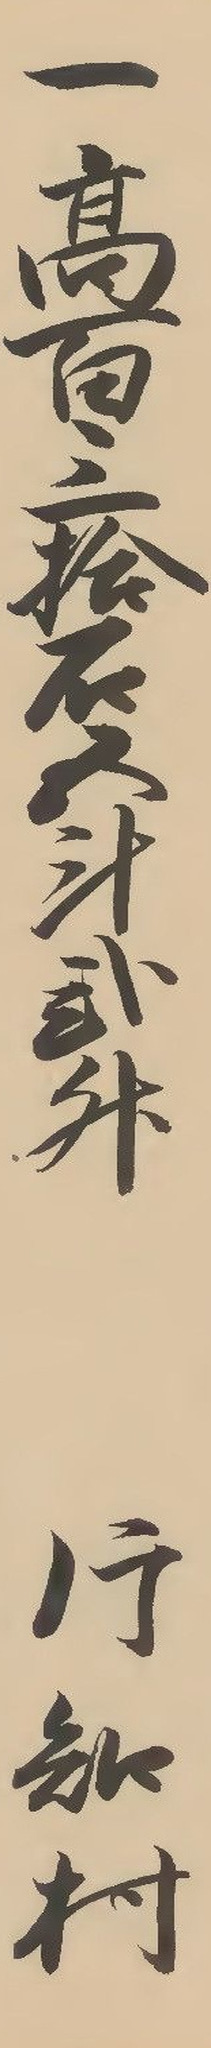一高百三拾石五斗弐升片知村
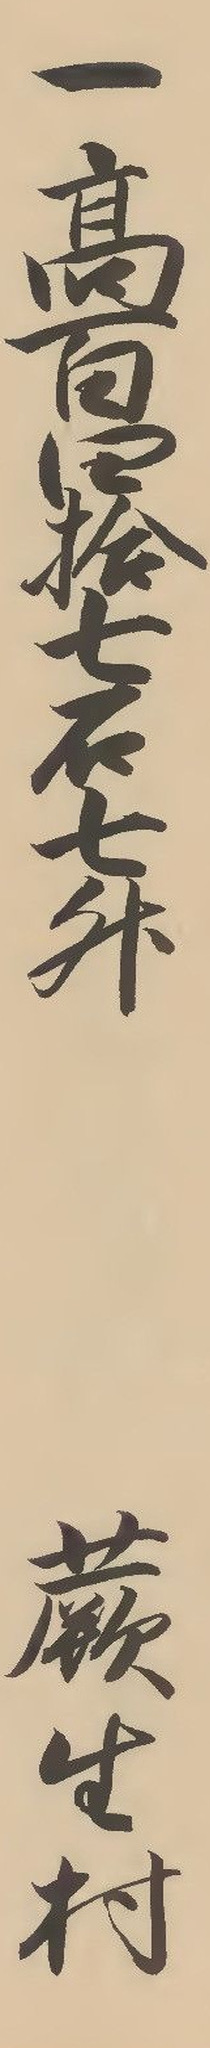一高百四拾七石七升蕨生村
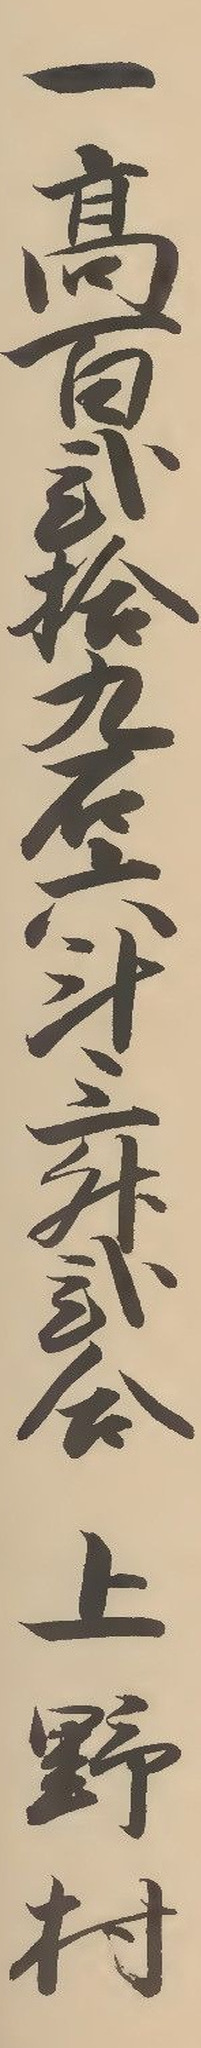一高百弐拾九石六斗三升弐合上野村
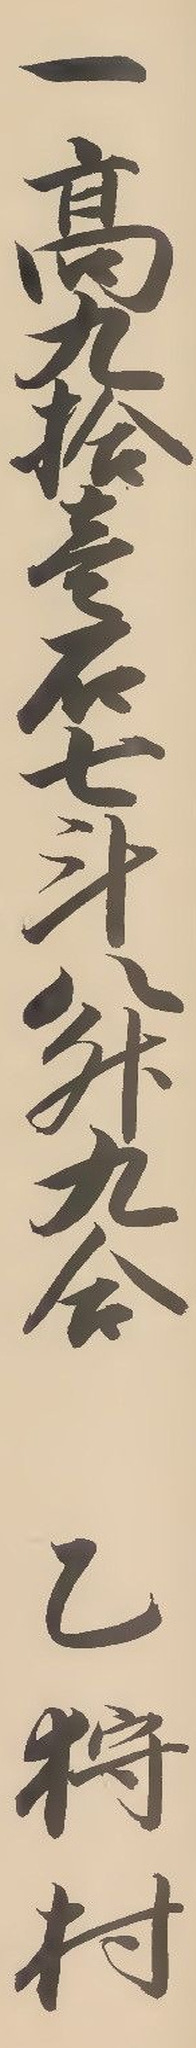一高九拾壱石七斗八升九合乙狩村
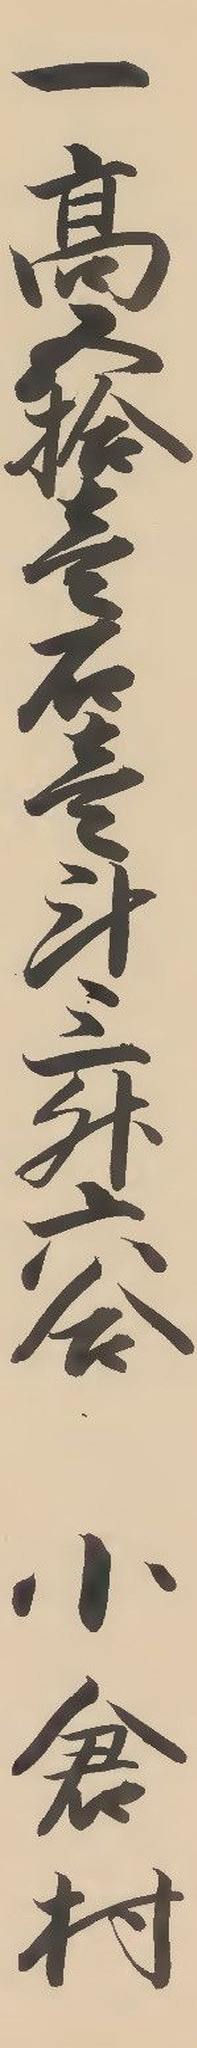一高五拾壱石壱斗三升六合小倉村
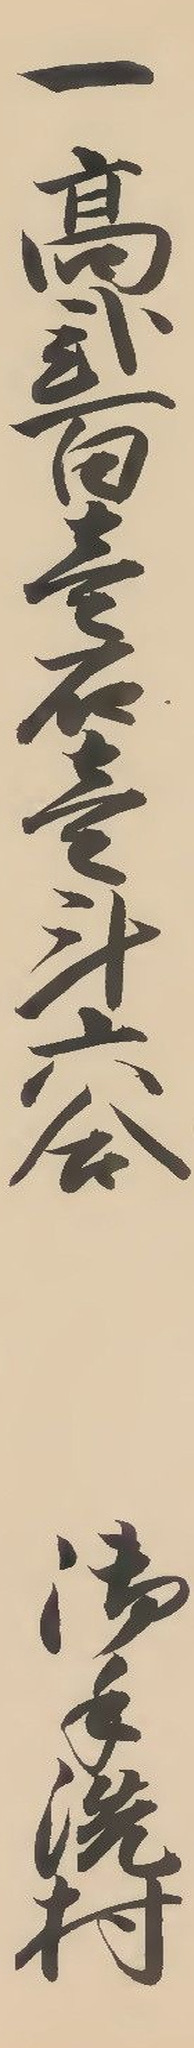一高弐百壱石壱斗六合御手洗村
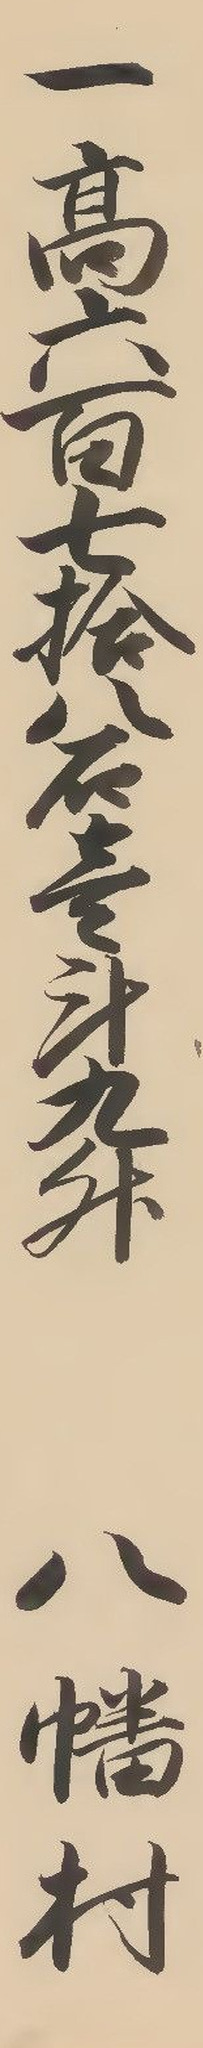一高六百七拾八石壱斗九升八幡村

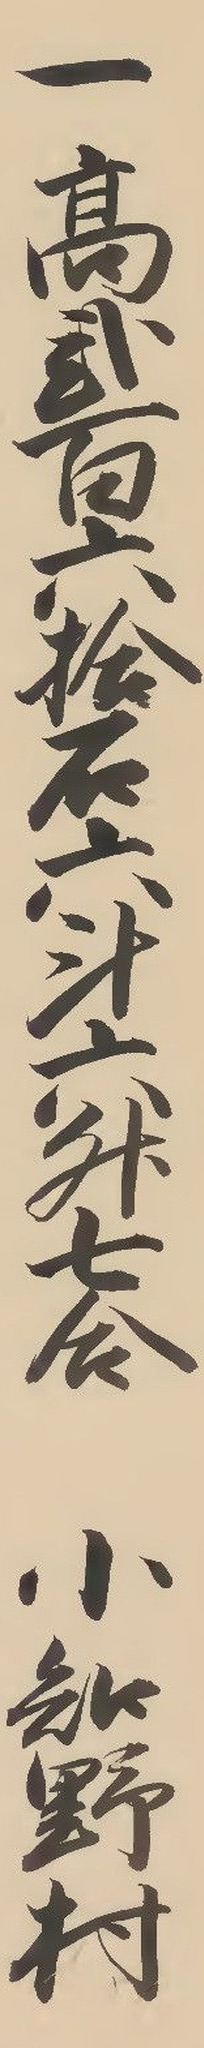一高弐百六拾石六斗六升七合小知野村
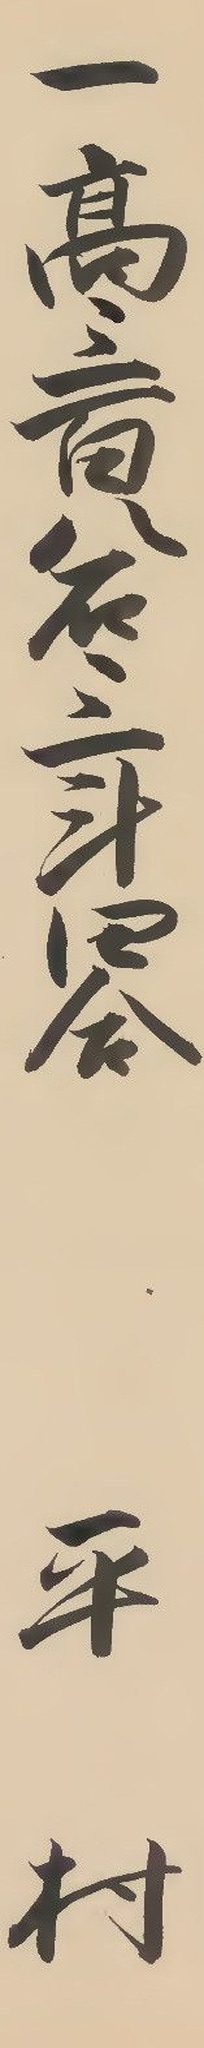一高三百八石三斗四合平村
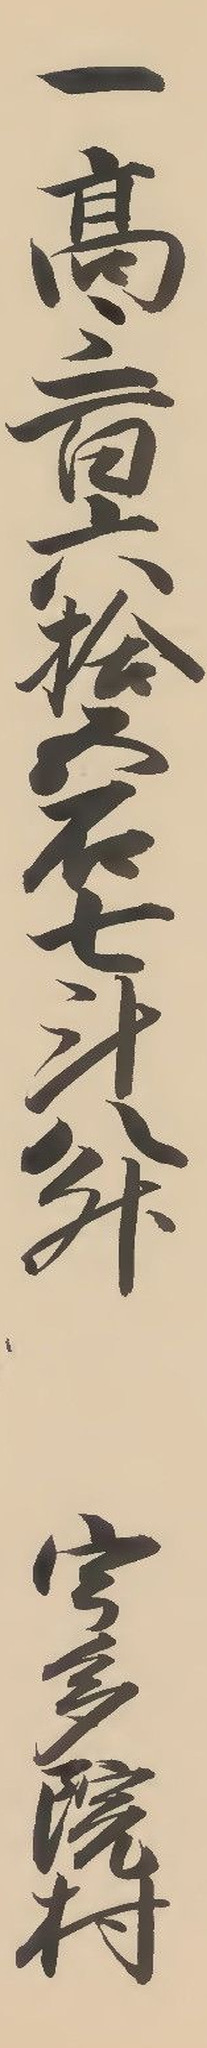一高三百六拾五石七斗八升宇多院村
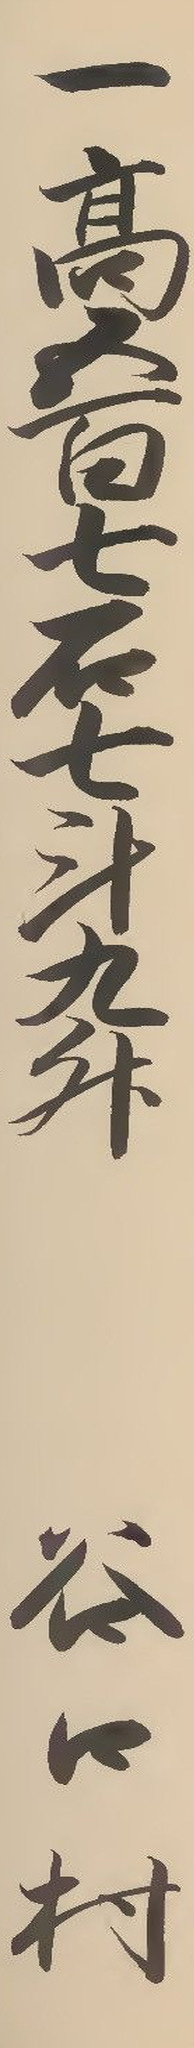一高五百七石七斗九升谷口村
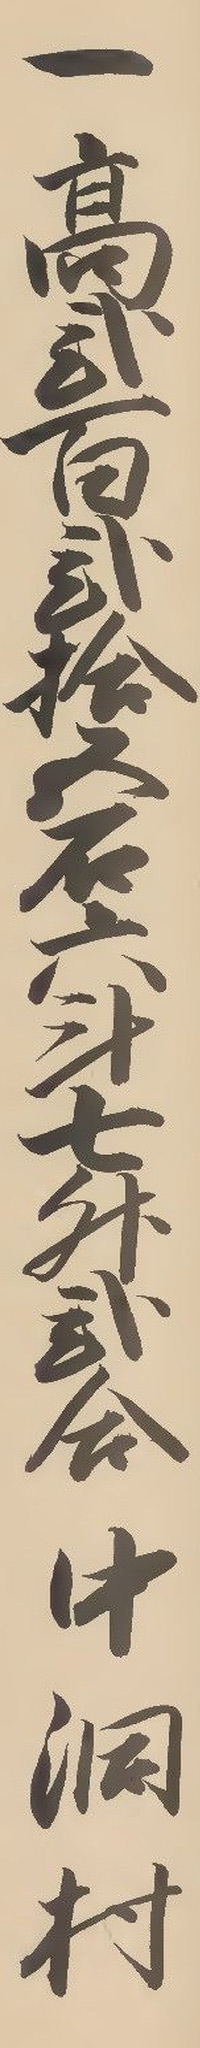一高弐百弐拾五石六斗七升弐合中洞村
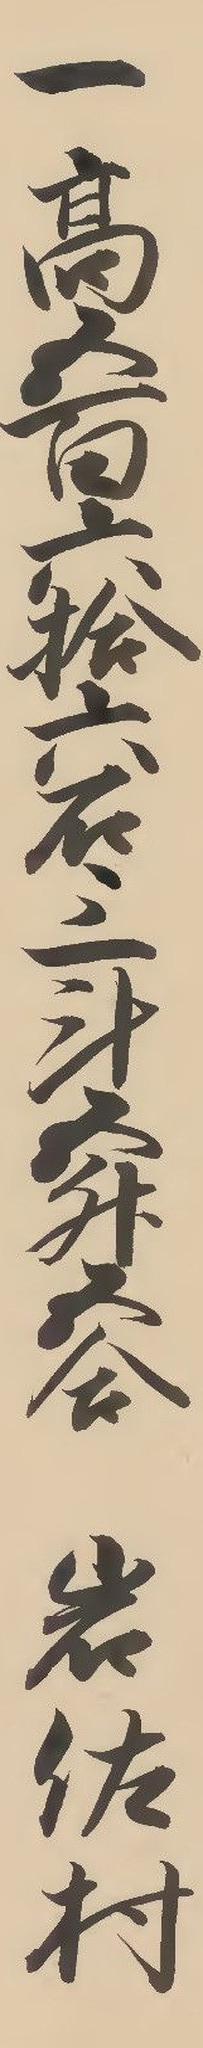一高五百六拾六石三斗五升五合岩佐村
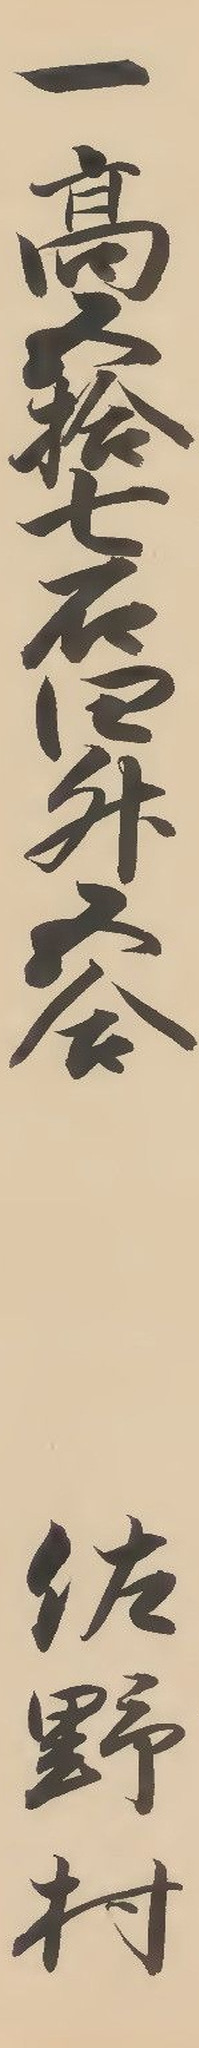一高五拾七石四升五合佐野村
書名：美濃国郷帳
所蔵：国立公文書館 National Archives of Japan
